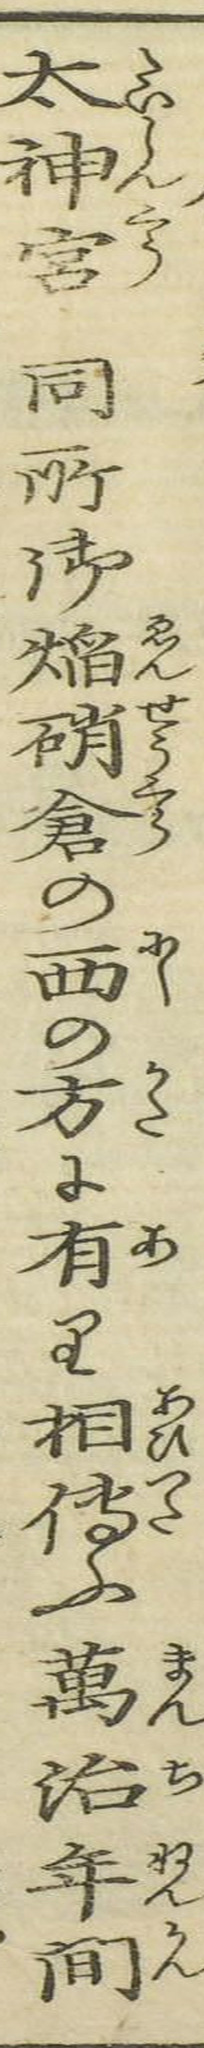太神宮同所御焔硝倉の西の方に有り相伝ふ萬治年間
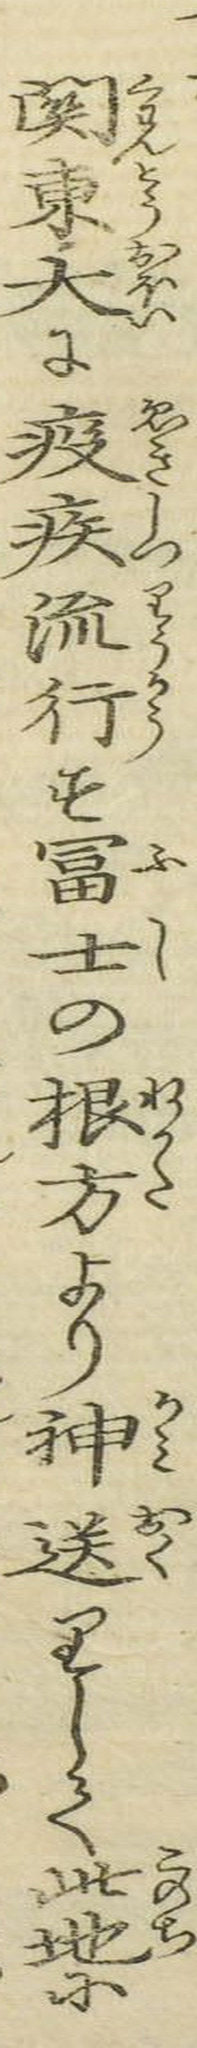関東大に疫疾流行す富士の根方より神送りして此地に
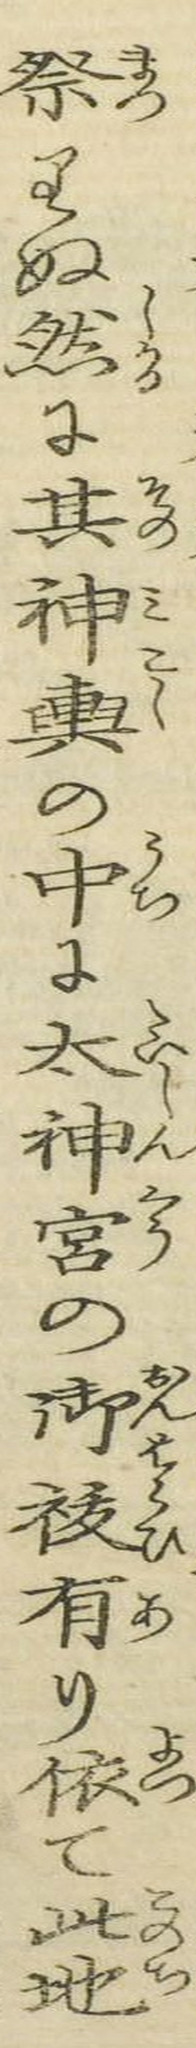祭りぬ然に其神輿の中に太神宮の御祓有り依て此地
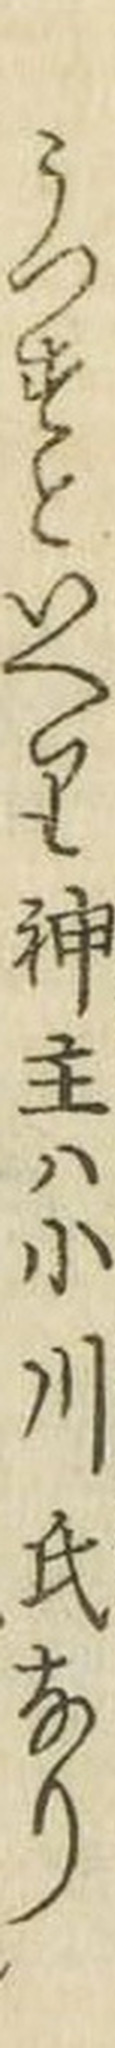うつすといへり神主は小川氏なり
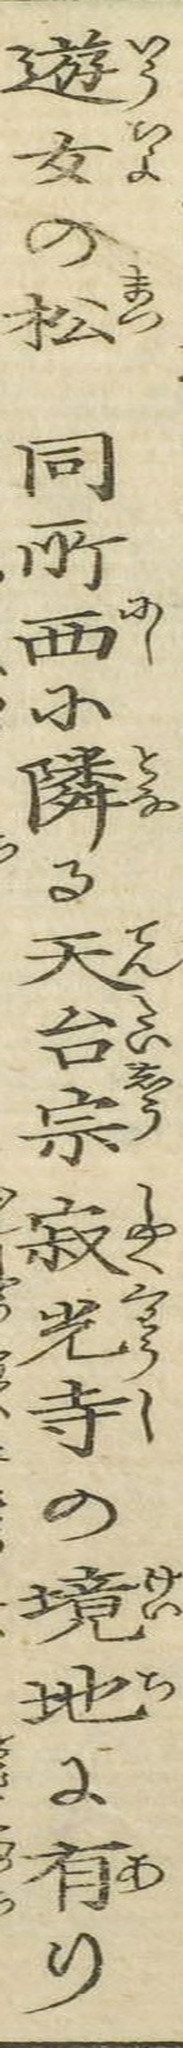遊女の松同所西に隣る天台宗寂光寺の境地に有り
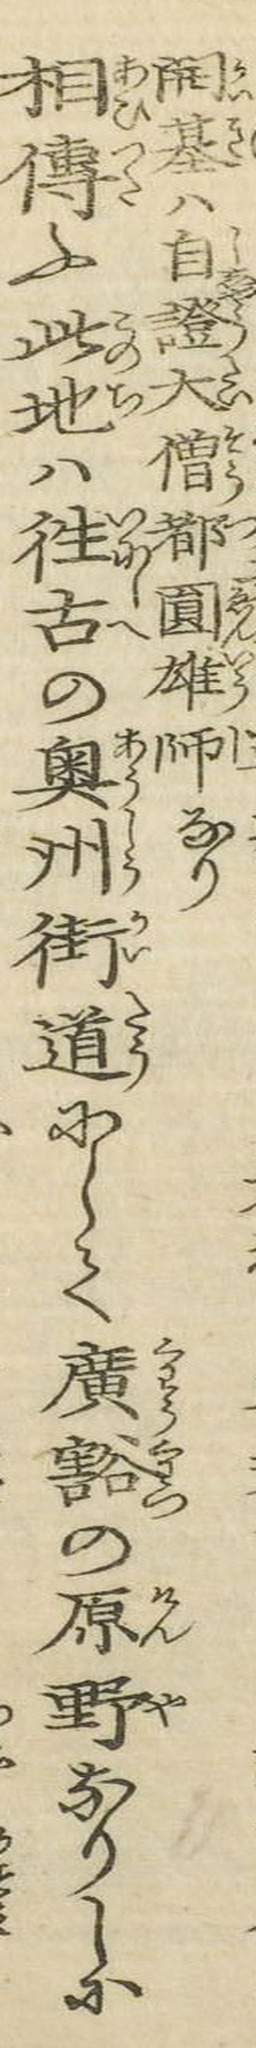相伝ふ此地は往古の奥州街道にして広豁の原野なりしに
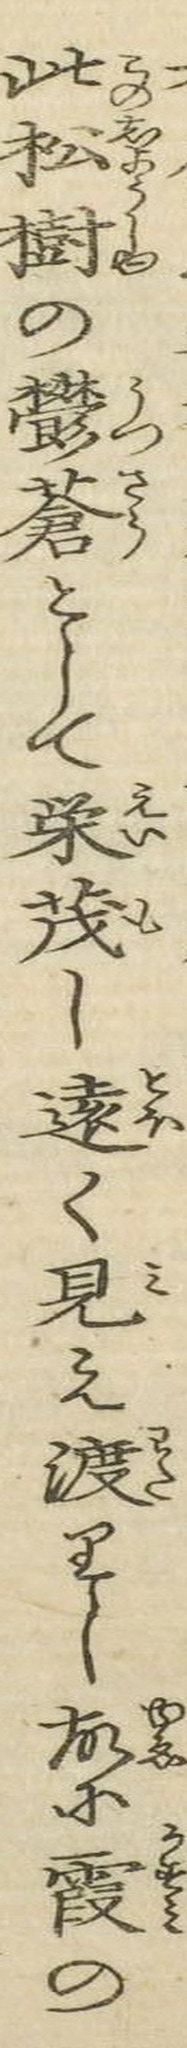此松樹の鬱蒼として栄茂し遠く見え渡りし故に霞の
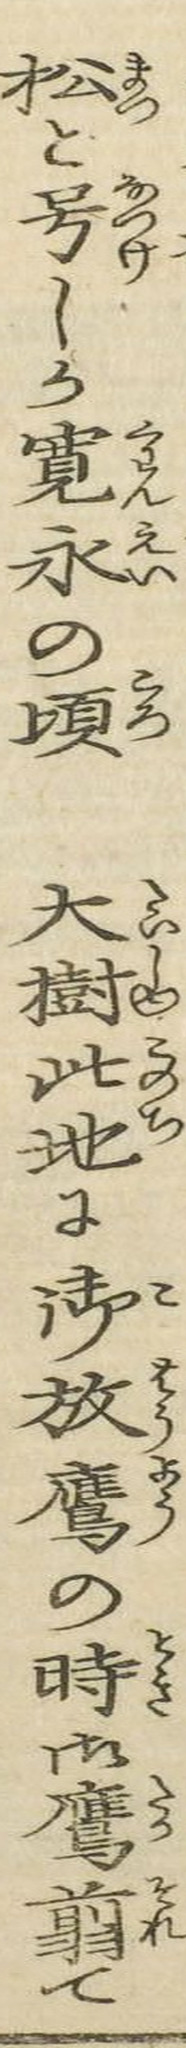松と号しか寛永の頃大樹此地に御放鷹の時御鷹翦て
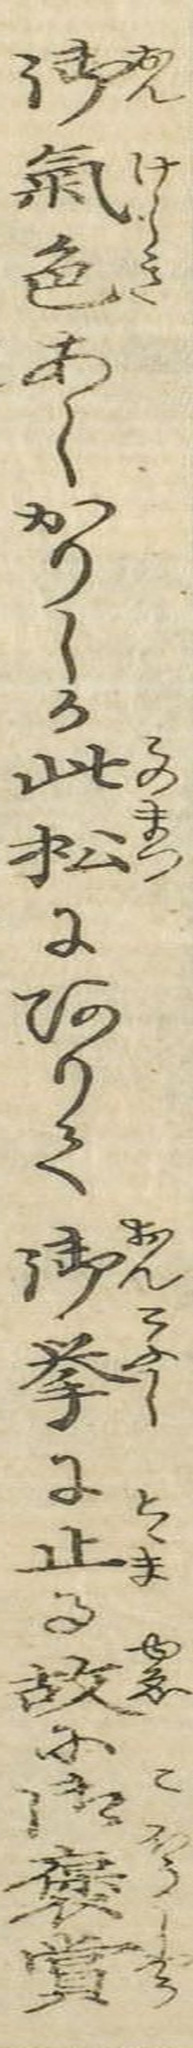御気色あしかりしか此松にありて御拳に止る故に御褒賞
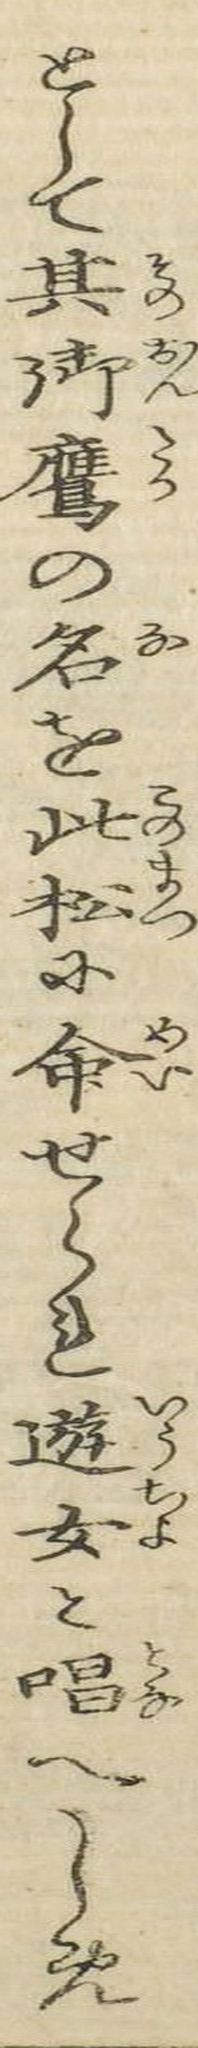として其御鷹の名を此松に命せられ遊女と唱へしめ
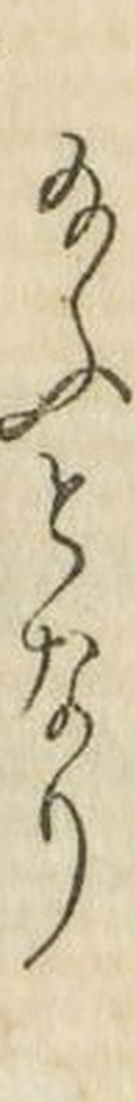給ふとなり
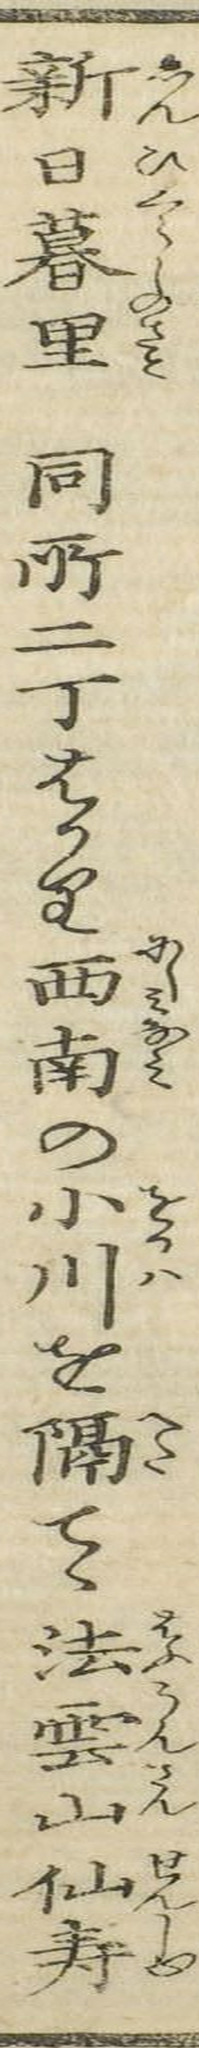新日暮里同所二丁はかり西南の小川を隔てゝ法雲山仙寿
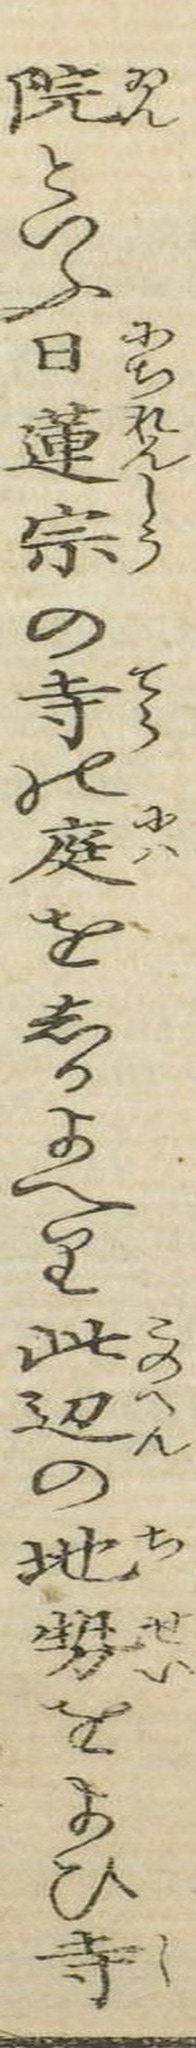院といふ日蓮宗の寺の庭をしかよへり此辺の地勢をよひ寺
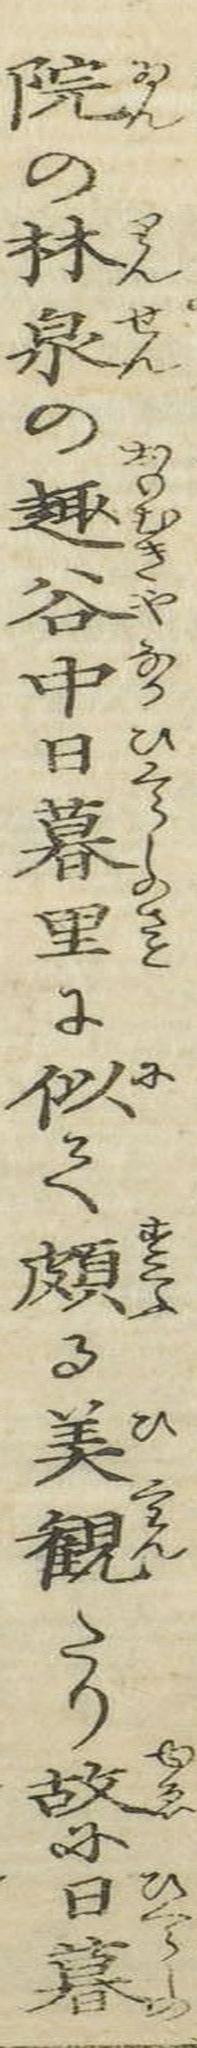院の林泉の趣谷中日暮里に似て頗る美観たり故に日暮
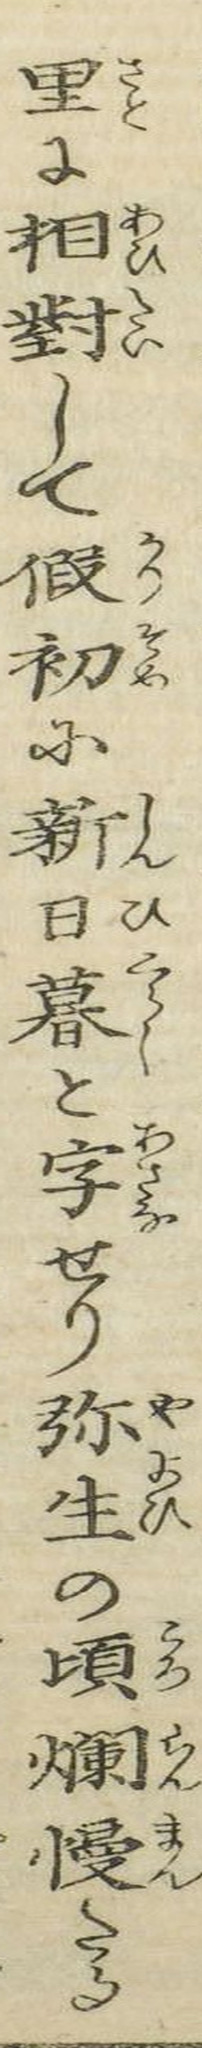里に相対して仮初に新日暮と字せり弥生の頃爛漫たる
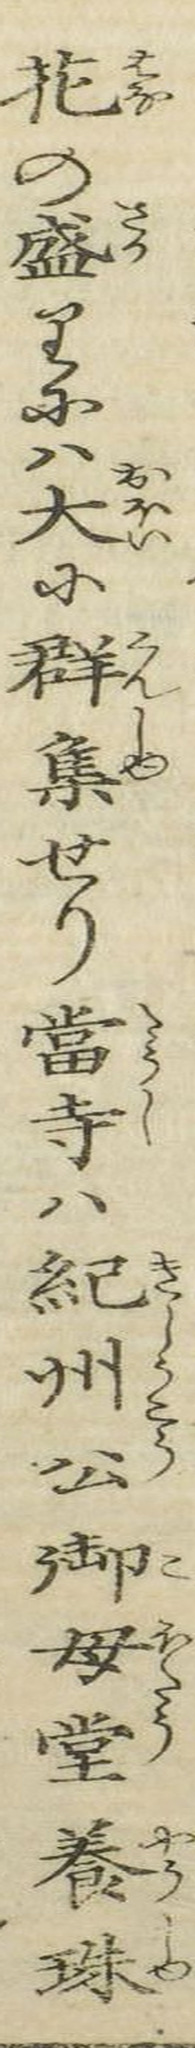花の盛りには大に群衆せり当寺は紀州公御母堂養珠
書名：江戸名所図会 20巻 巻之9
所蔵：東京学芸大学教育コンテンツアーカイブ
